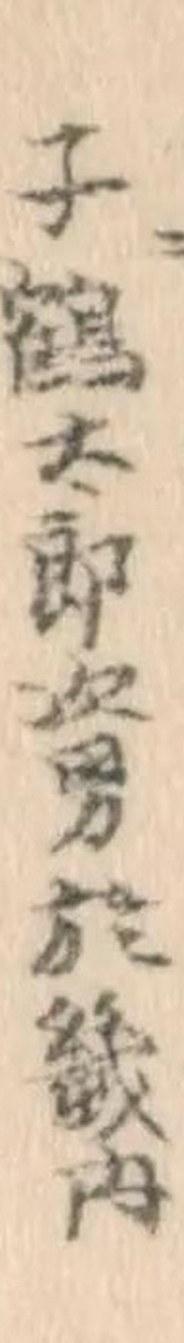子鶴太郎次男於畿内
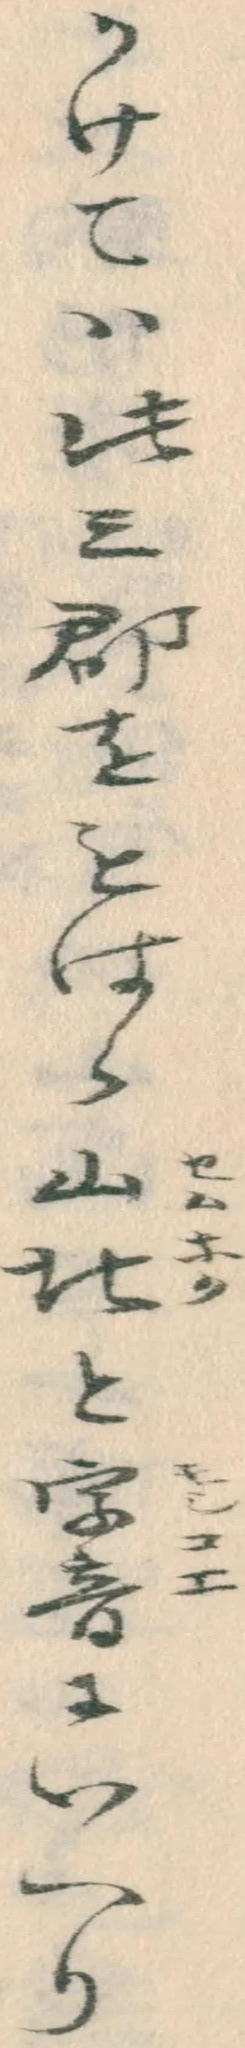かけては此三郡をもはら山北と字音にいへり
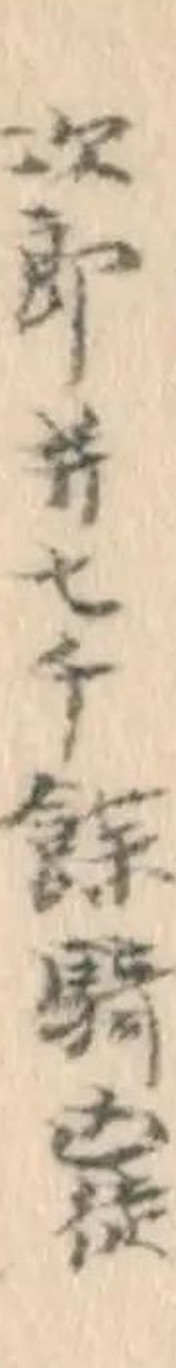次郎并七千餘騎凶徒
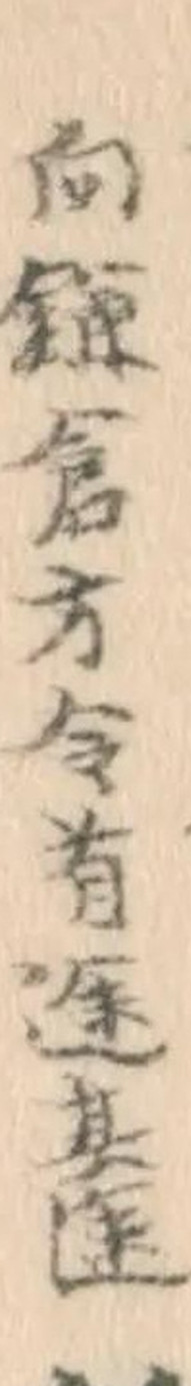向鎌倉方令首途其途
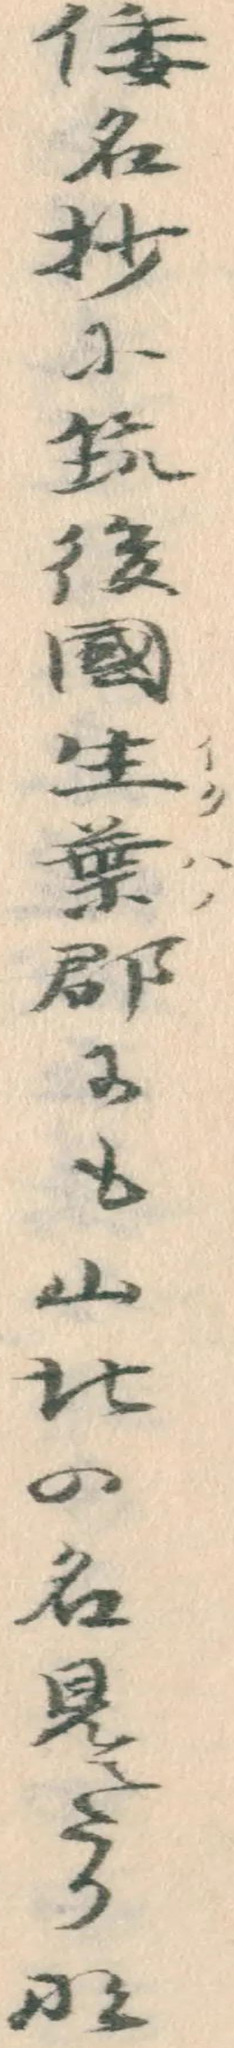倭名抄に筑後國生葉郡にも山北の名見えたりな
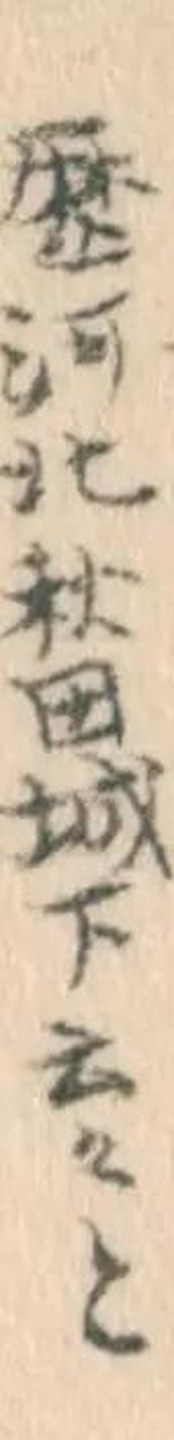歴河北秋田城下云々と
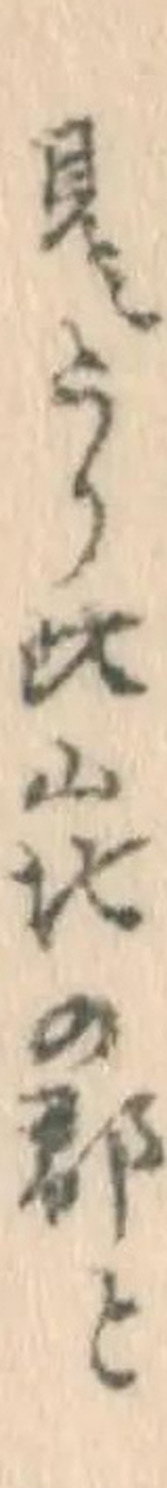見えたり此山北の郡と
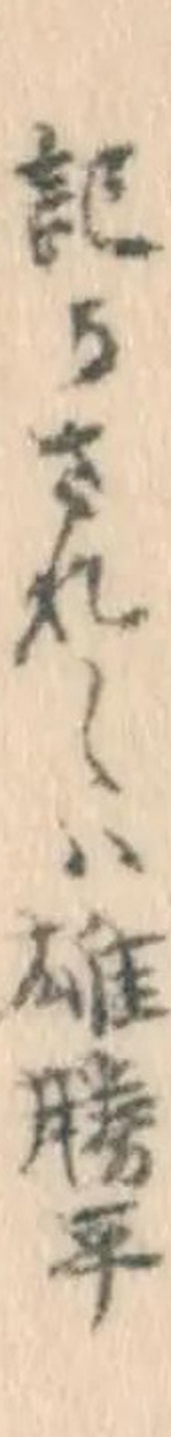記るされしは雄勝平
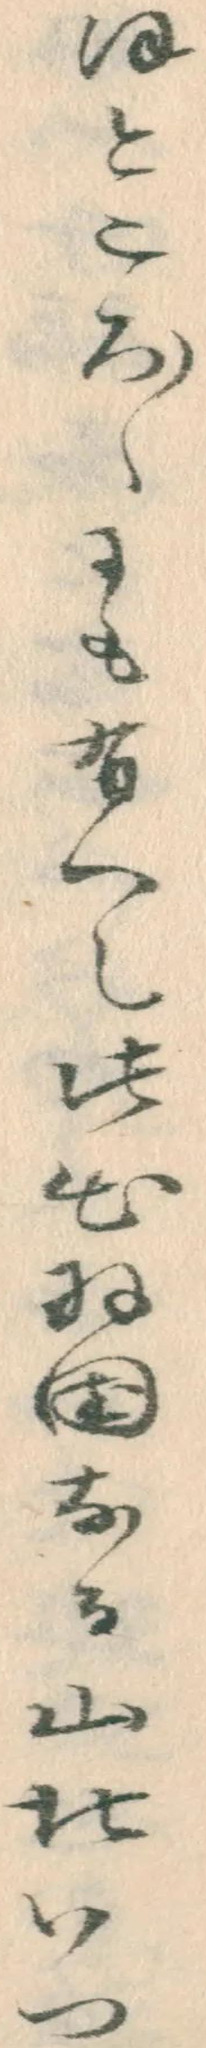ほところ〳〵にも有へし此出羽国なる山北いつ
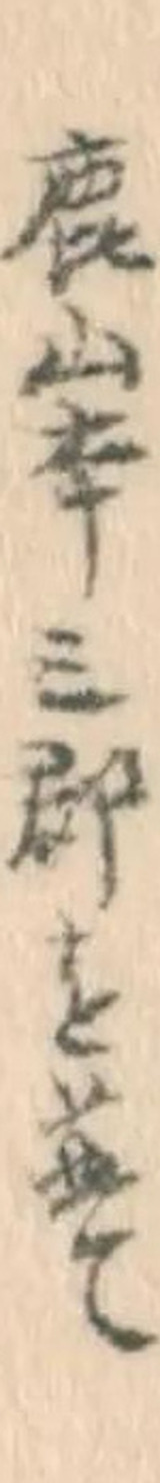鹿山本三郡を並て
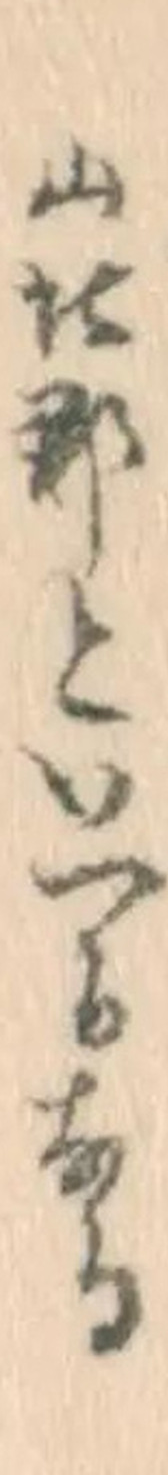山北郡といへるなる
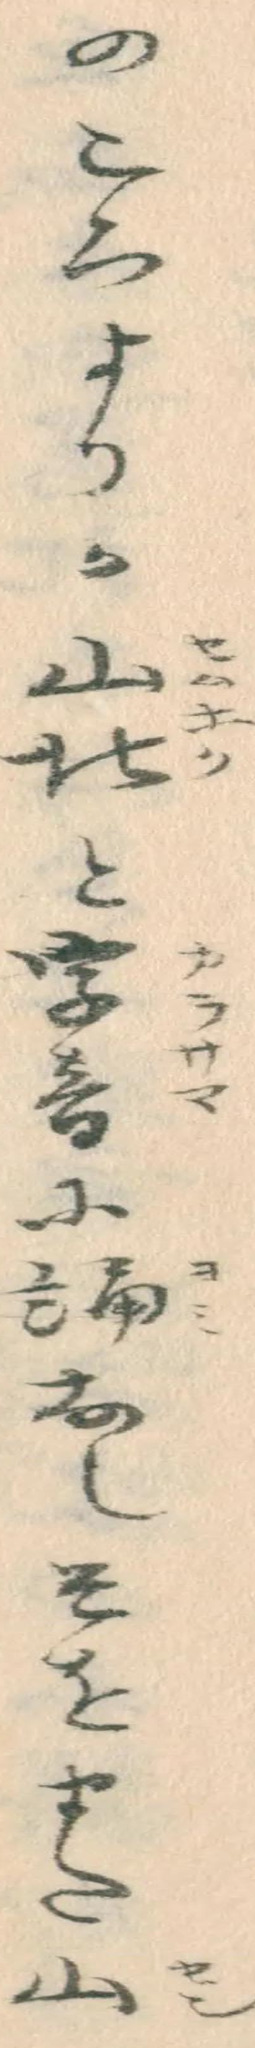のころよりか山北と字音に誦なしそをまた山

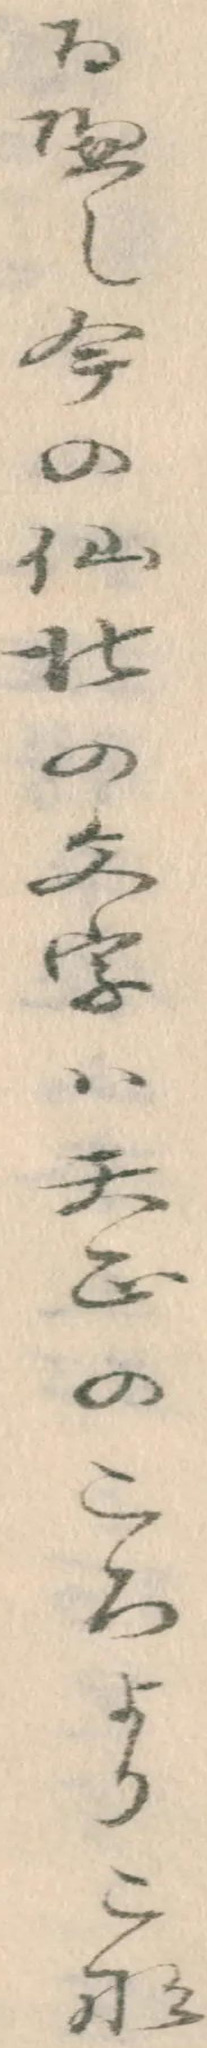るへし今の仙北の文字は天正のころよりこな
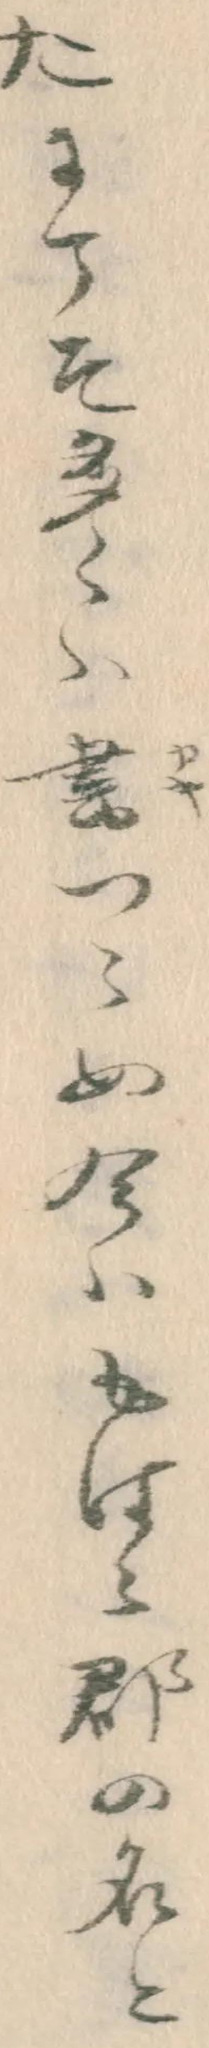たにこそ多くは書つらめ今はもはら郡の名と
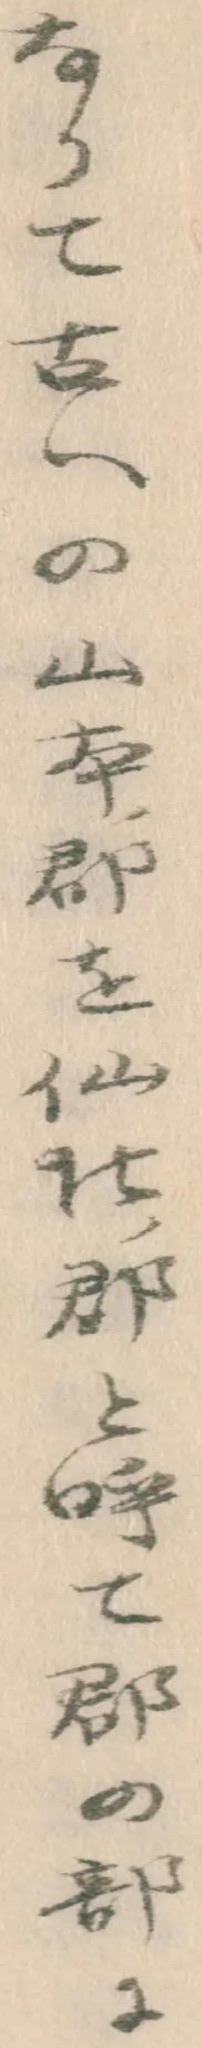なりて古への山本郡を仙北郡と呼て郡の部に
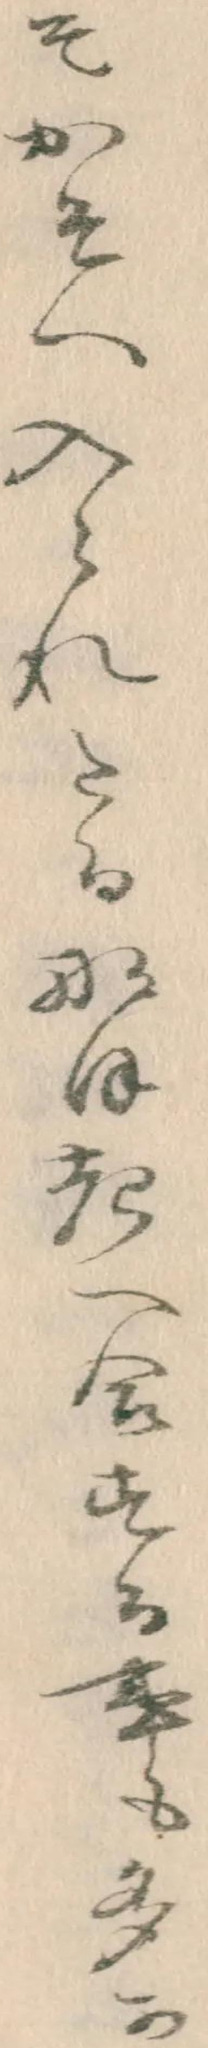そかそへ入られたるなほ考へ合する事も多か
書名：眞澄遊覽記[第2冊]
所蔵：国立国会図書館 National Diet Library, JAPAN
